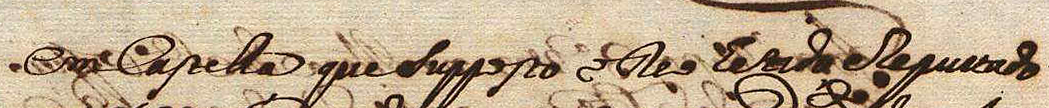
em Castella que Supposto o Reo he tido e Reputtado
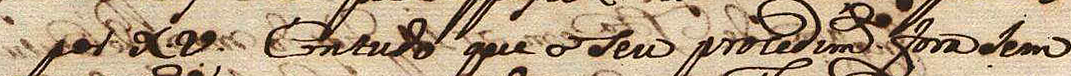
por XV. Contudo que o seu procedim.to fora sem
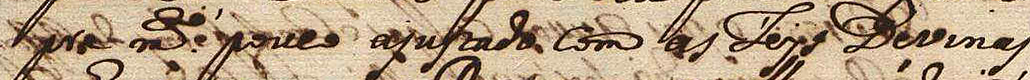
pre m.to e pouco ajustado com as Leys Devinas,
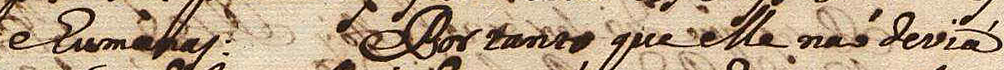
e humanas: Portanto, que elle naõ devia
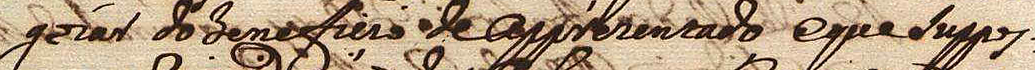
gozar do beneficio de Apprezentado e que suppos
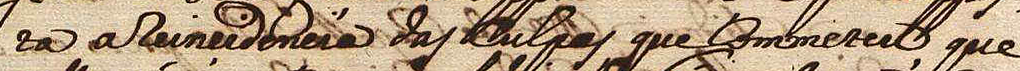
ta a Reincidencia das culpas que Commeteu, que
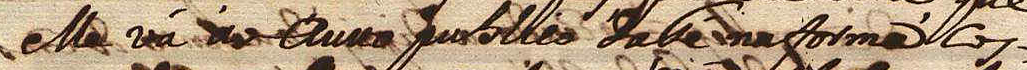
elle va ao Autto publico da Fé na forma Cos
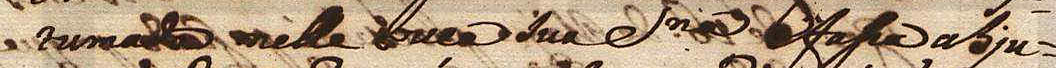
tumada nelle ouça sua Sna e fassa abju
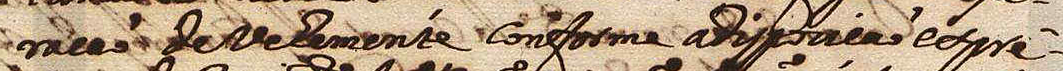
raçaõ de Vehemente conforme a dispozição expre
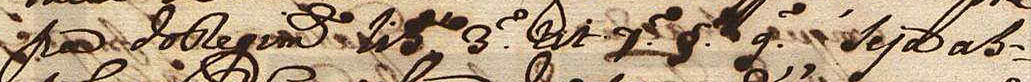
sa do Regim.to libo 3.o tit 7.o §. 9.o seja ab
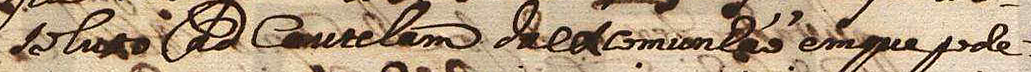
soluto ad Cautelam da excomunhaõ em que pode
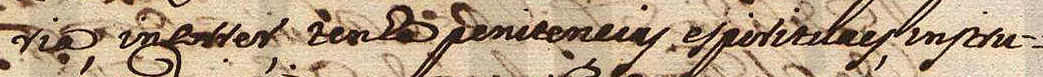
ria incorrer, tenha penitencias espirituaes, instru
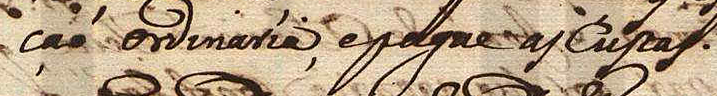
çaõ ordinaria, e pague as Custas.
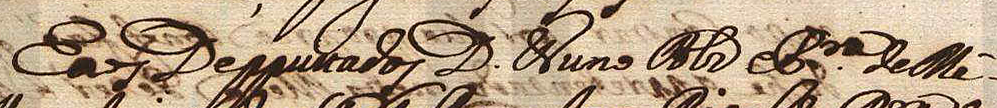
E aos Depputtados D. Nuno Alz̄ P.ra de Me
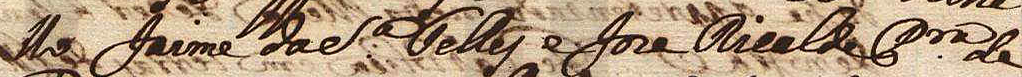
llo, Jaime da S.a Telles, e Joze Ricalde P.ra de
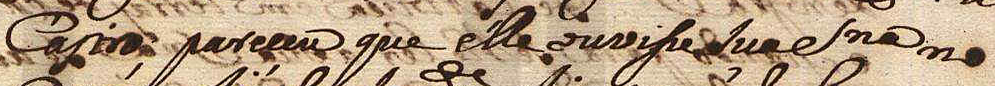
Castro, pareceu que elle ouvisse sua S.na no
